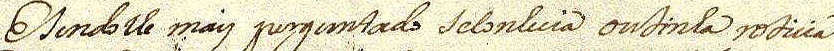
E Sendo lhe mais perguntado se conhecia ou tinha noticia
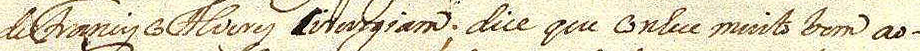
de Francisco Alveres Cirurgiam; dice que conhece muito bem ao
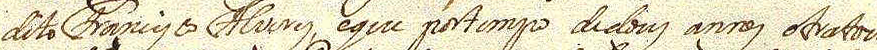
dito Francisco Alveres, e que por tempo de dous annos o tratou
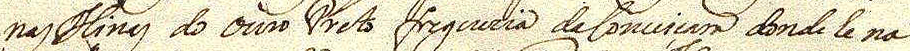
nas Minas do Ouro Preto freguezia de Conceiçam donde he na
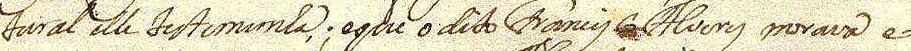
tural elle testemunha, ; e que o dito Francisco Alveres morava e
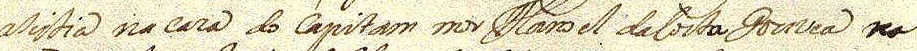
asistia na caza do capitam mor Manoel da Costa Gouvea na
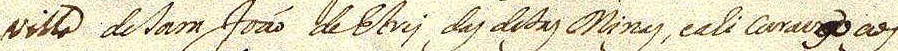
villa de Sam João de Elrej das ditas Minas, e ahi curava aos
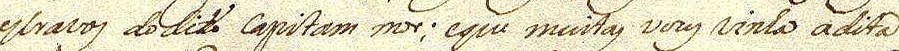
escravos do dito capitam mor; e que muitas vezes vinha a dita
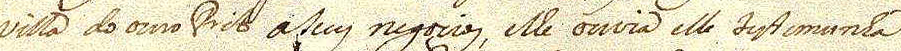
villa do ouro Preto a seus negocios, e lhe ouvia elle testemunha
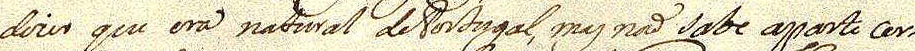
dizer que era natural de Portugal, mas naõ sabe a parte cer
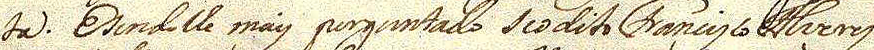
ta. E sendolhe mais perguntado se o dito Francisco Alveres
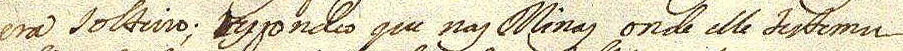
era Solteiro; respondeo que nas Minas onde elle testemu
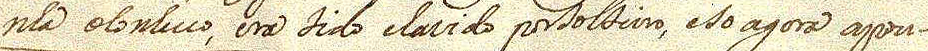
nha o conheceo, era tido e havido por Solteiro, e so agora a pou
